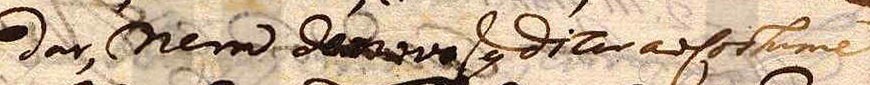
dar, nem de novo q̄ dizer ao Costume
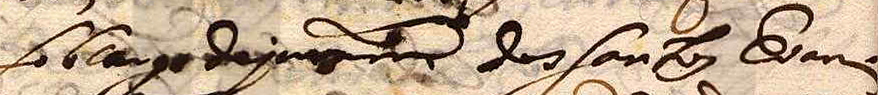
sob cargo do juramto dos santos Evan
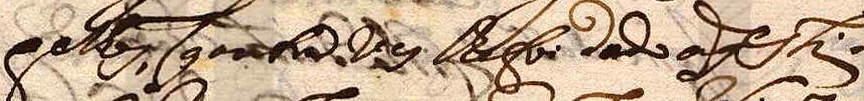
gelhos, q̄ outra ves lhe foi dado a q̄ esti
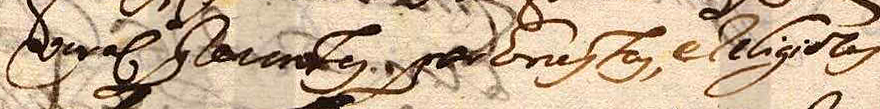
veraõ pRezentes por honestas, e Religiozas
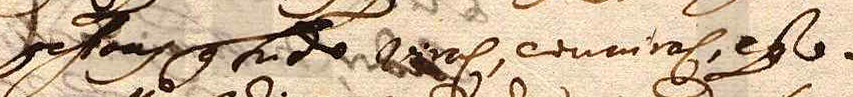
pessoas q̄ tudo viraõ, e ouuiraõ, e pRo
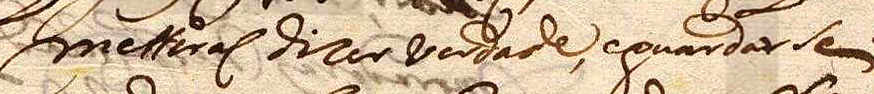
metteraõ dizer verdade, e guardar se
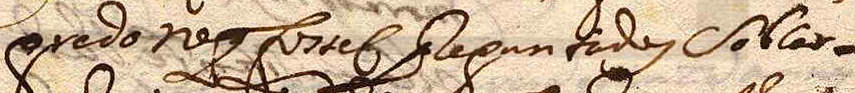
gredo no q̄ fossē pReguntados sob car
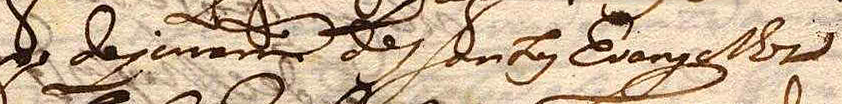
do do juramto dos santos Evangelhos
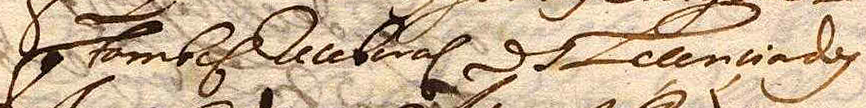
q̄ tambē Receberaõ os Lecenciados
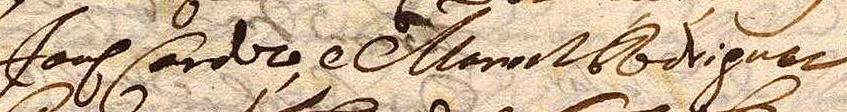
Joaõ Cardozo, e Manoel Rodriguez
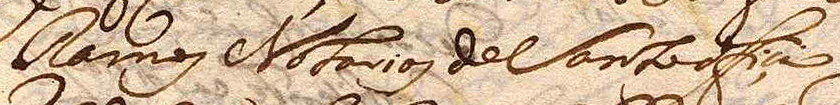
Ramos Notarios do Santo officio
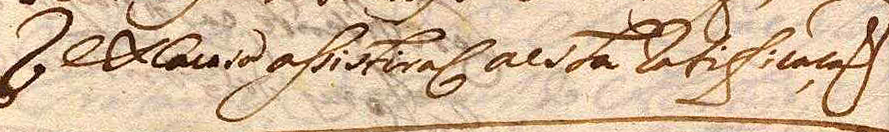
q̄ Excausa assistiraõ a esta Ratificaçaõ
